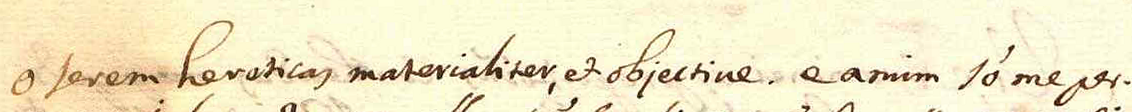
o serem hereticas materialiter, et objectiue. e a mim só me per
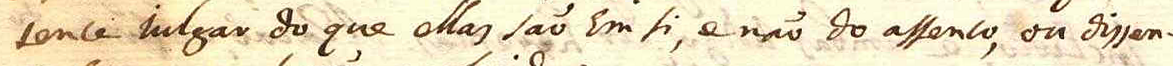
tence iulgar do que ellas saõ Em si, e naõ do assenço, ou dissen
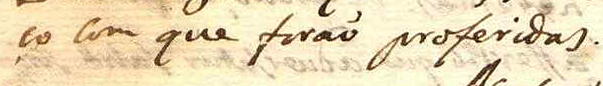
ço com que foraõ proferidas.
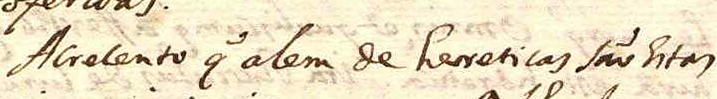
Acrecento q̄ alem de hereticas saõ Estas
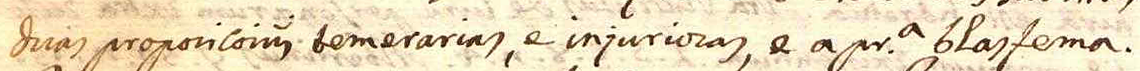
duas propoziçoin̄s temerarias, e injuriozas, e a pr.a blasfema.
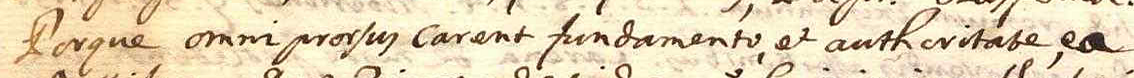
Porque omni prorsus carent fundamento, et authoritate, e a
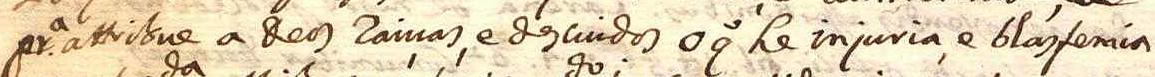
pr.a attribue a Deos Raiuas, e descuidos o q̄ he injuria, e blasfemia.
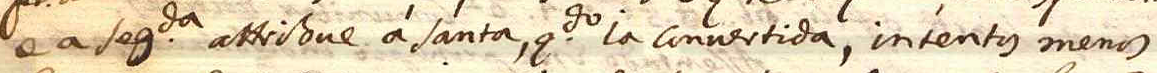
e a seg.da attribue à Santa, q.do ia conuertida, intentos menos
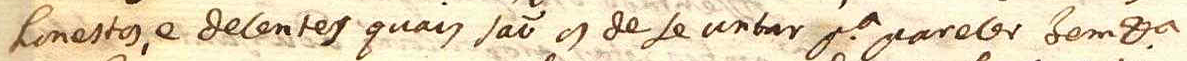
honestos, e decentes quais saõ os de se untar p.a parecer bem &.a
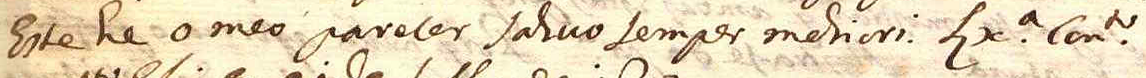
Este he o meo parecer saluo semper meliori Lx.a Con.to
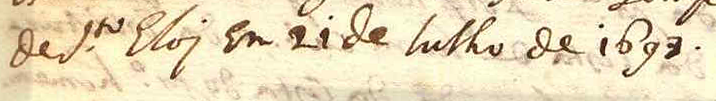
de S.to Eloj Em 2i de Iulho de i698.
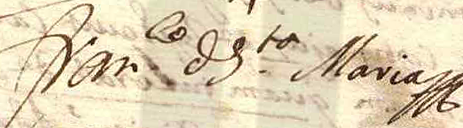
Franco de S.ta Maria
